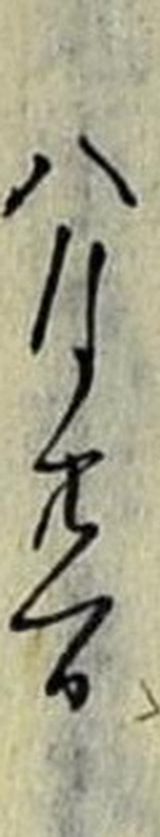八月廿一日
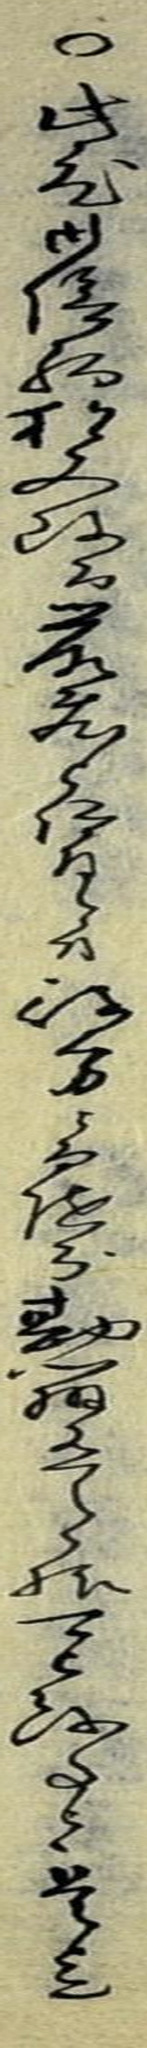〇此度御倹約猶又改而厳敷被仰付候に付役方に而随分勘弁有之候様可被致事に候是迄
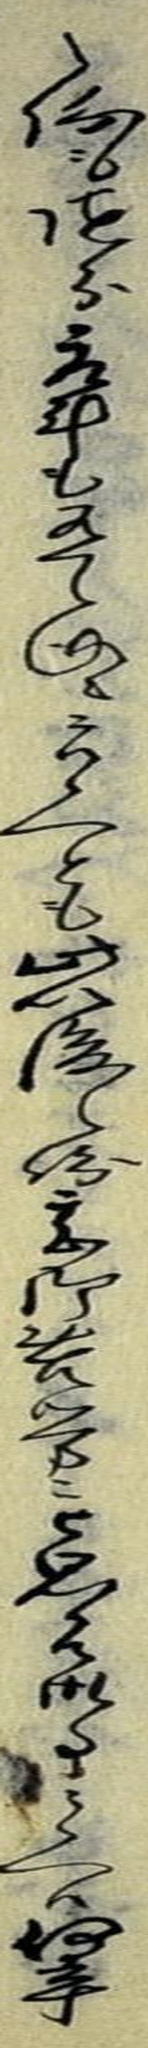之儀も随分取斗も有之候趣には候へとも此以後之儀甚御苦労に被思召御事に候へは何卒
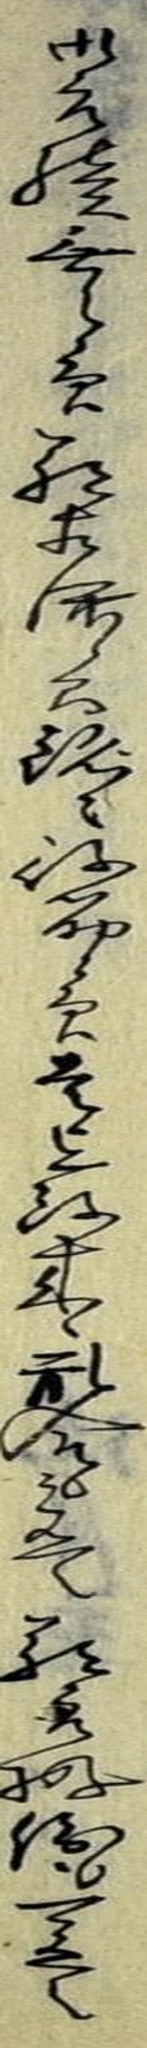御取続無之候而は難相済候間銘々役筋に而は是迄致来候形合も有之難取扱儀も可有之
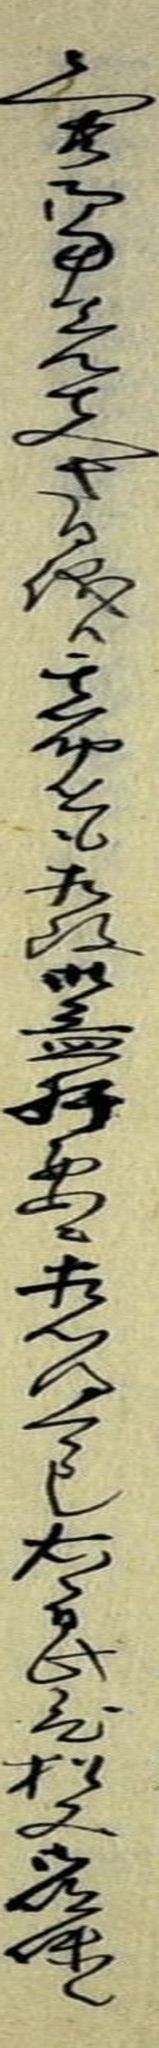候へ共御用差支さる儀は其筋をも相改御益肝要に相心得可申候右に付此度猶又御吟味之
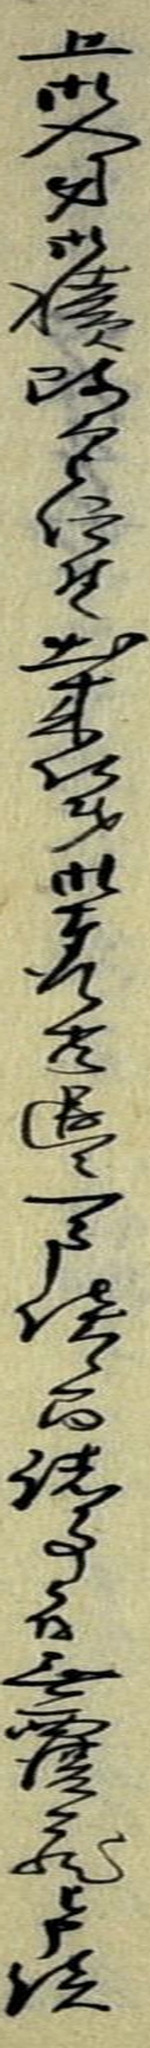上御入用御積改而被仰付候出来次第御奉行共追々可申談候間諸事に付無覆蔵被申談
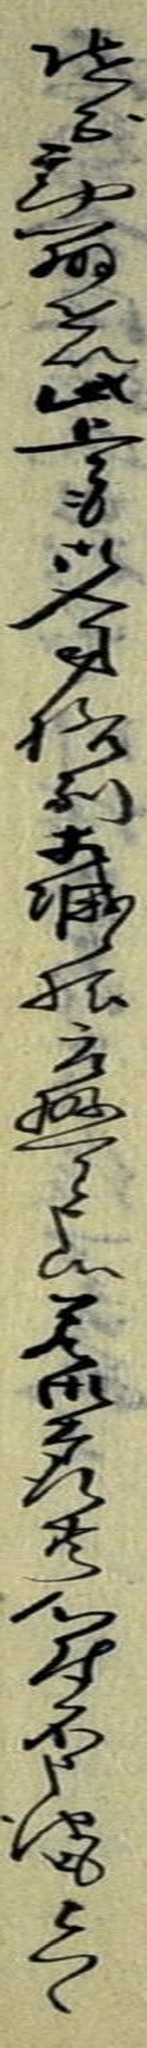随分勘弁を以此上にも御入用格別相減候様取扱可被申候若御奉行共心付不申儀も候はゝ
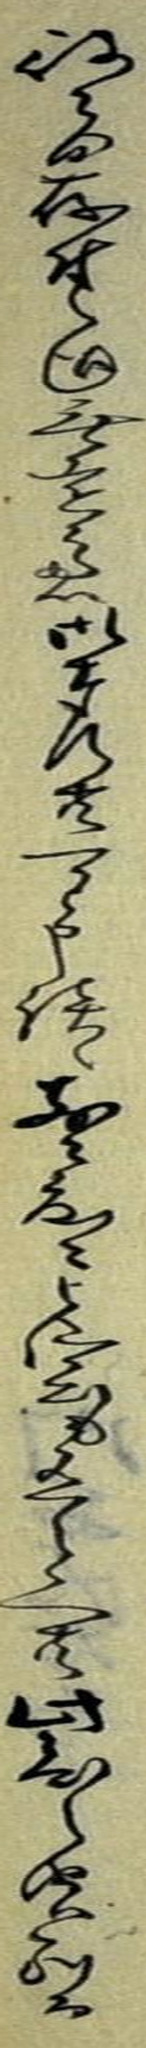役にゟ存付之趣無遠慮御奉行共可被申談候前に度々被仰出も有之候へ共此度之儀は別而
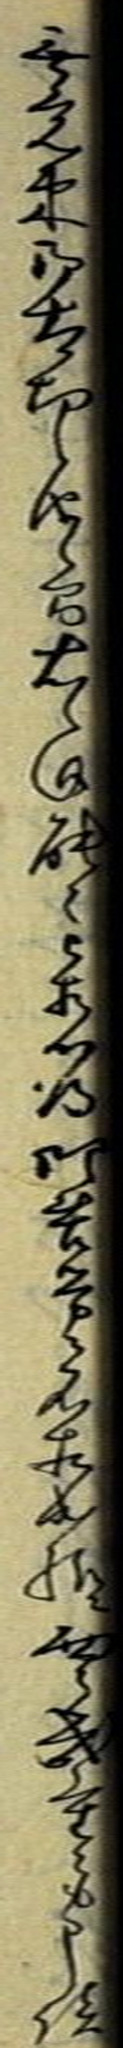無覚束御太切之儀候間右之趣能々被相心得御苦労に不相成様に面々幾重にも申談
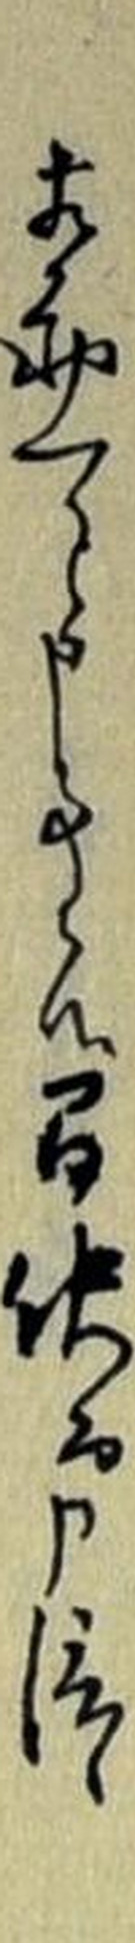相勤可被申事に候間訳而申渡候
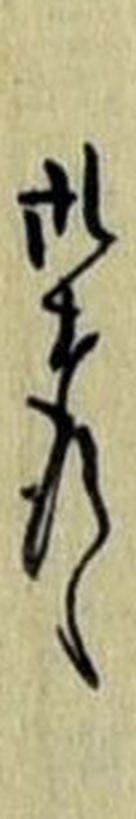御奉行へ
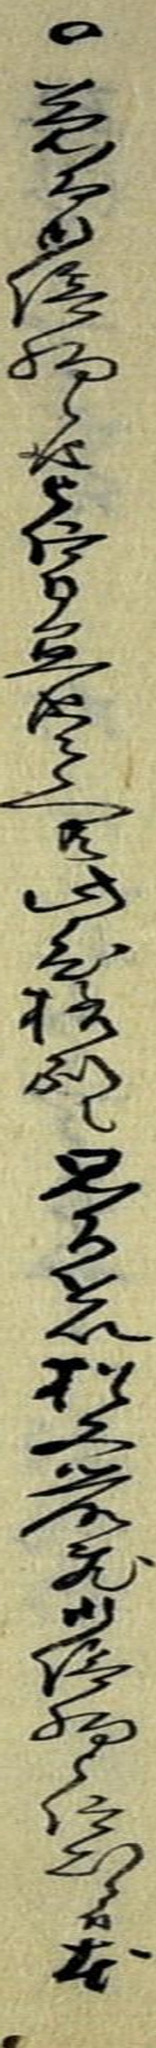〇兼而御倹約之儀被仰付置儀に候へ共此度格別之思召を以猶又厳敷御倹約被仰出候に付本
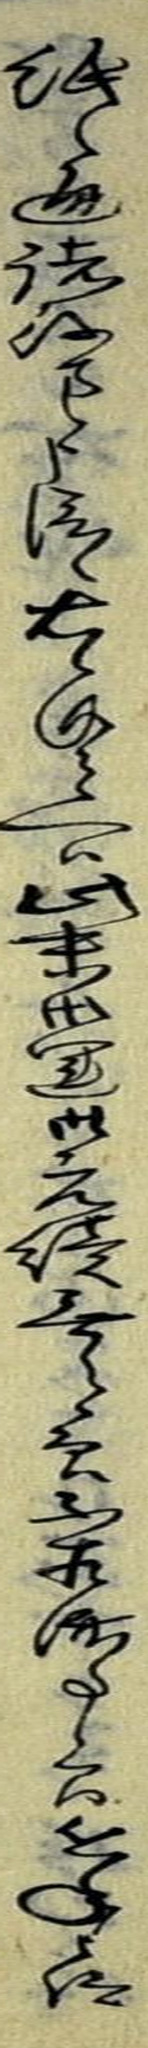紙之通諸役方へ申渡候右之趣に候へは此末御運御取続無之候而は不相済事候間近年被仰
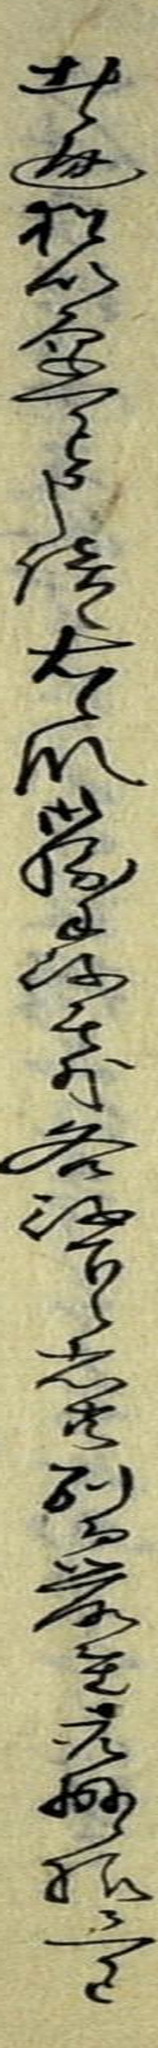出候通猶以厚可被申談候右之段御勝手役其外各役下之者共別而厳重に取扱候様に可被
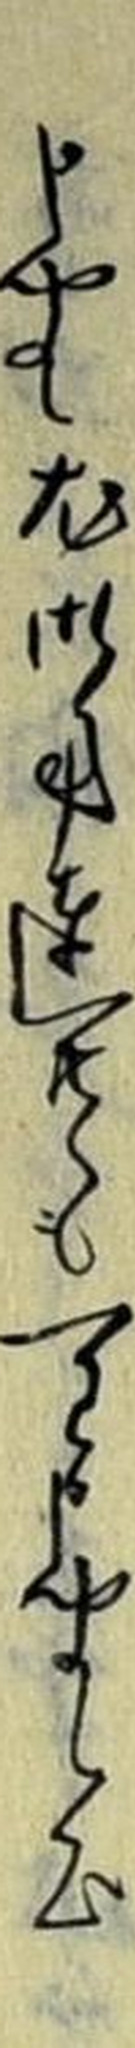申聞候尤御用達共へも可被申聞候以上
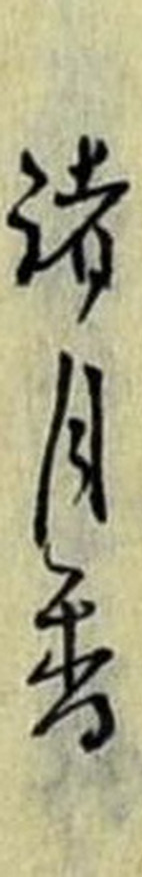諸月番
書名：命令之部 二
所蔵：福井県文書館 Fukui Prefectural Archives
